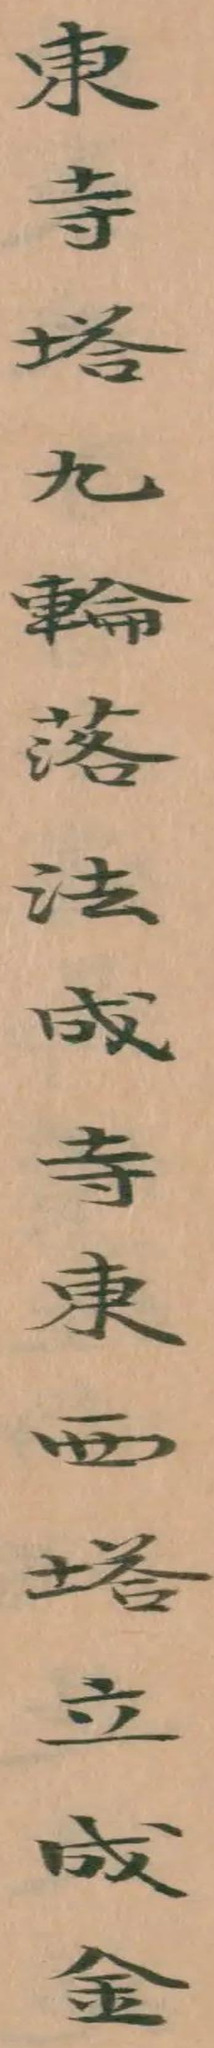東寺塔九輪落法成寺東西塔立成金
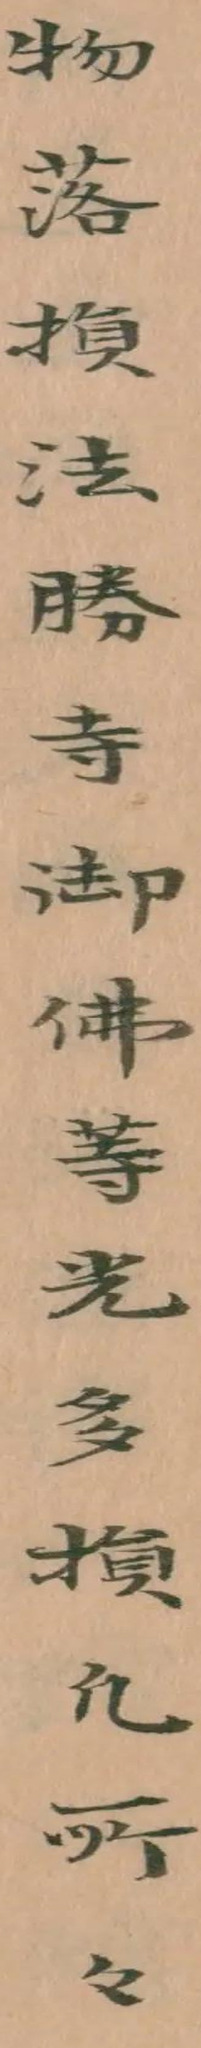物落損法勝寺御仏等光多損凡所々
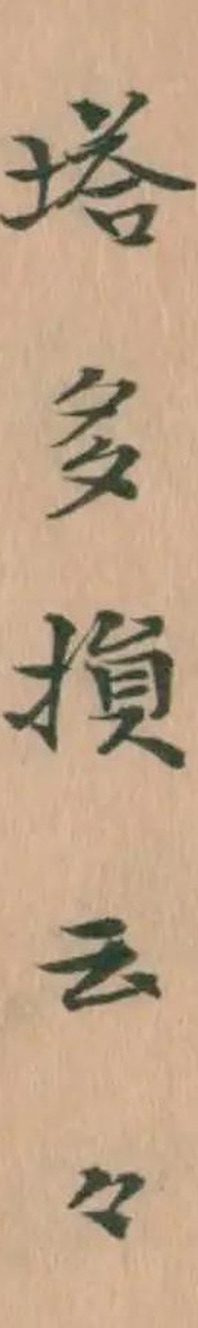塔多損云々
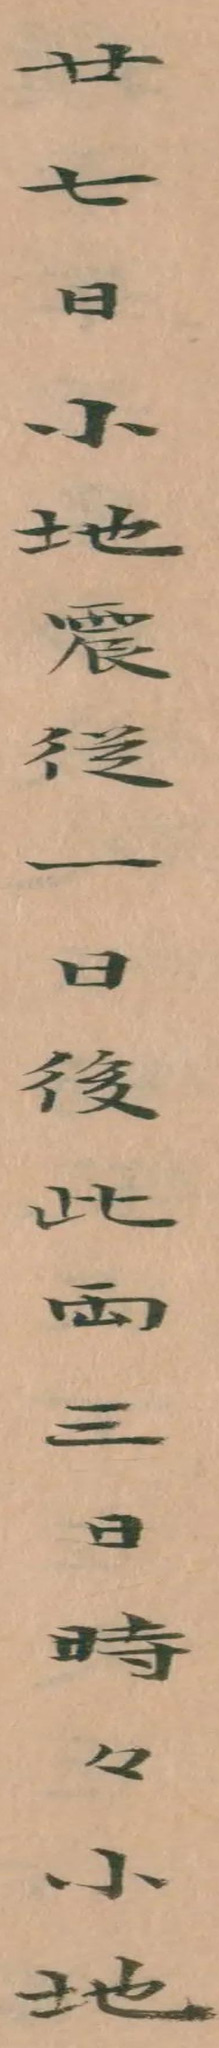廿七日小地震従一日後此両三日時々小地
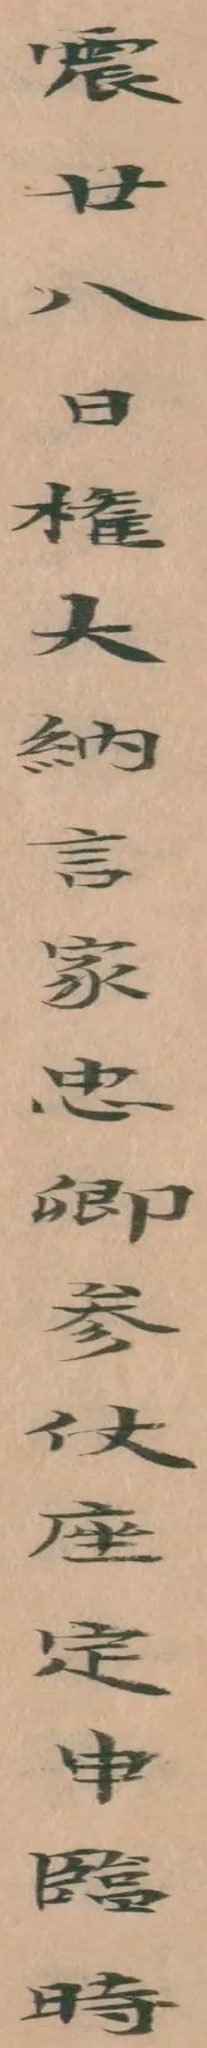震廿八日権大納言家忠卿参杖座定申臨時
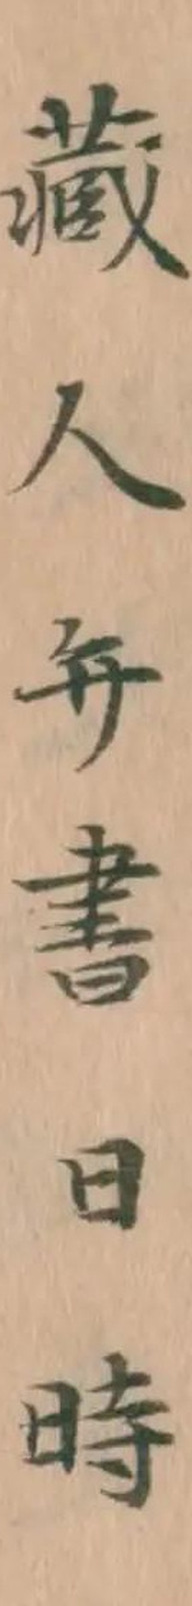蔵人弁書日時
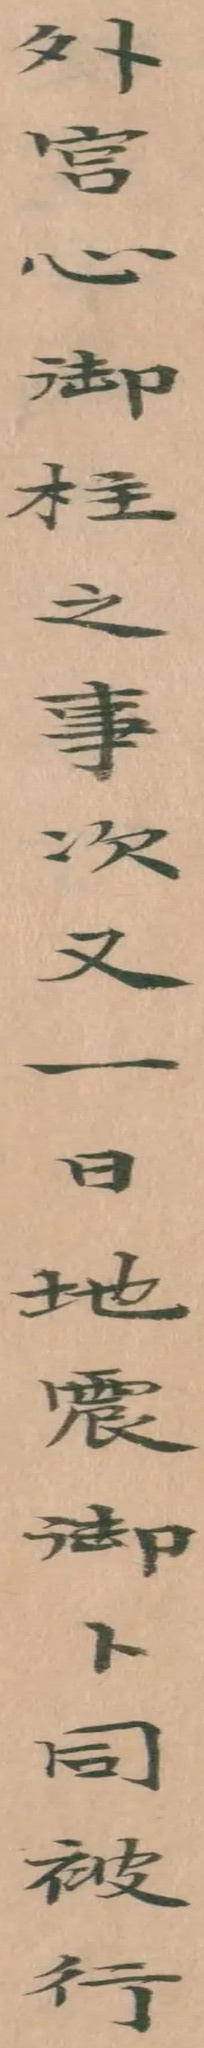外宮心御柱之事次又一日地震御卜同被行

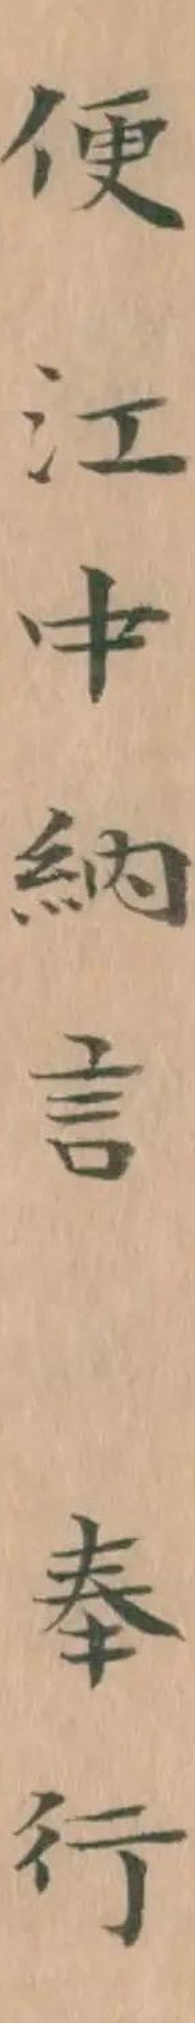便江中納言奉行
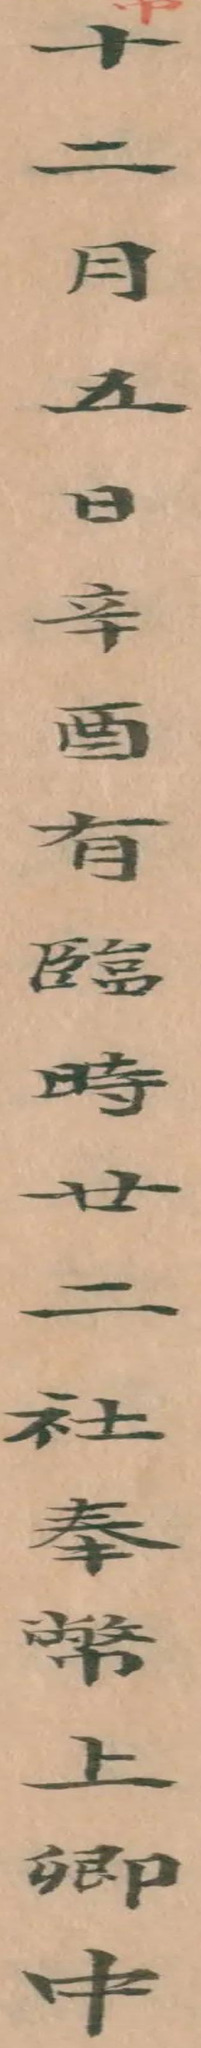十二月五日辛酉有臨時廿二社奉幣上卿中
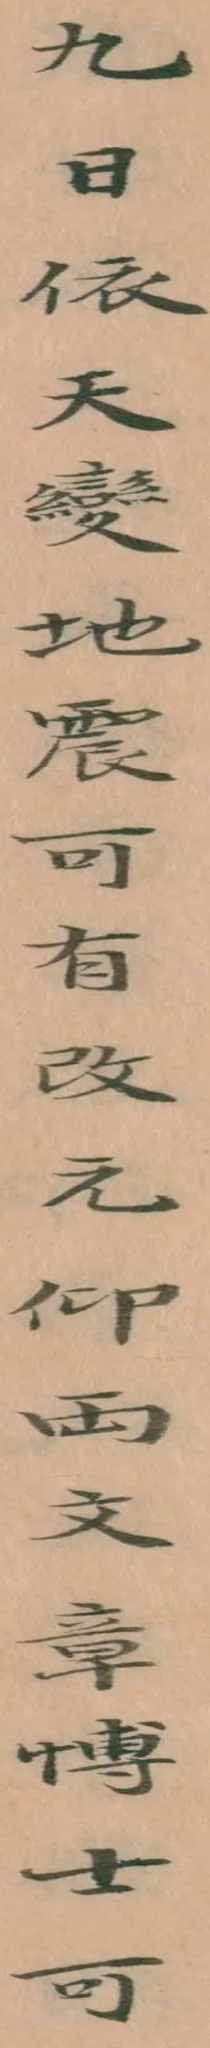九日依天変地震可有改元仰両文章博士可
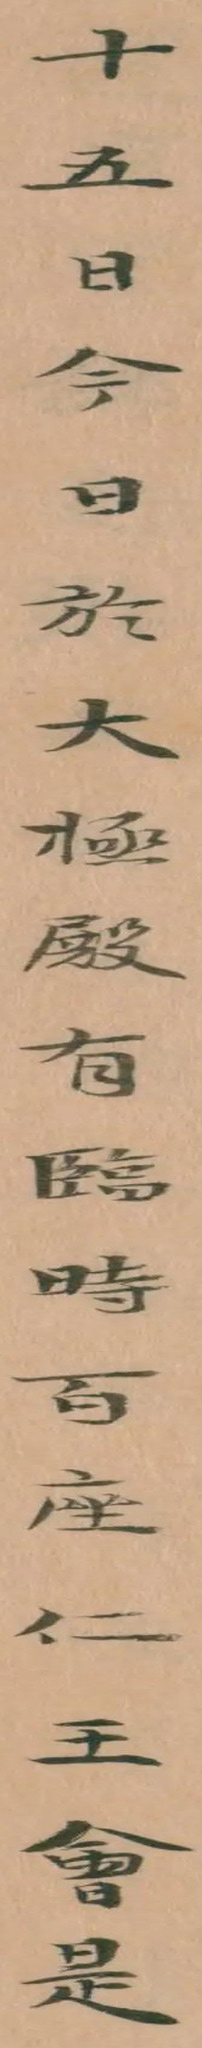十五日今日於大極殿有臨時百座仁王会是
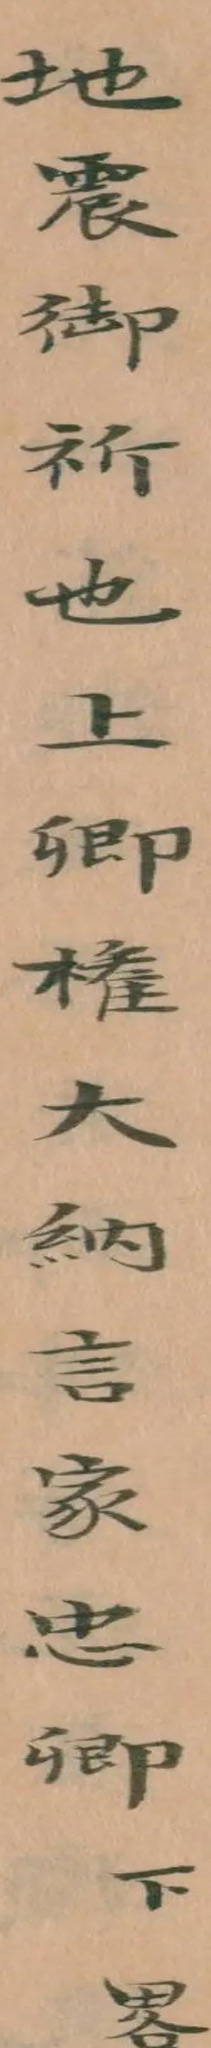地震御祈也上卿権大納言家忠卿下略
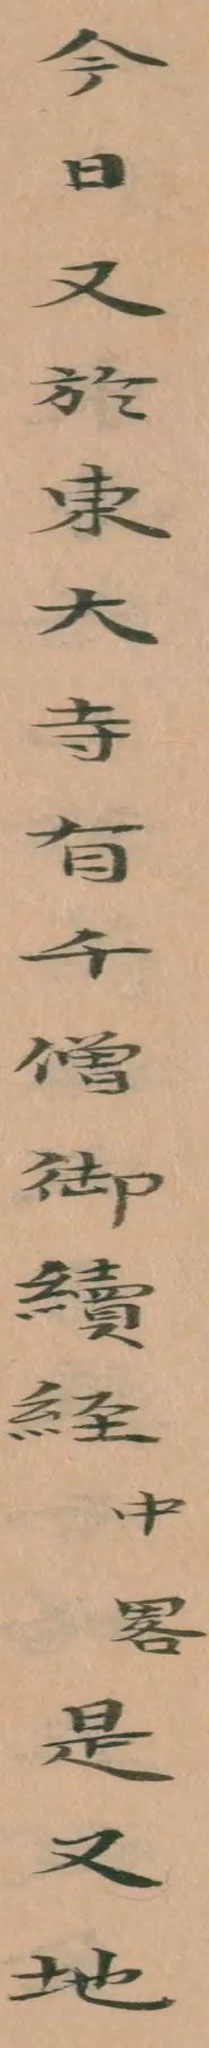今日又於東大寺有千僧御続経中略是又地
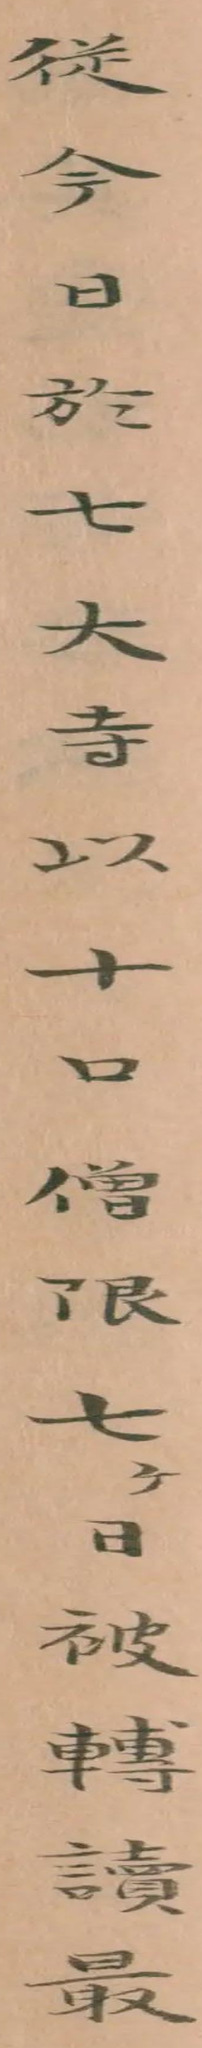従今日於七大寺以十口僧限七ヶ日被転読最
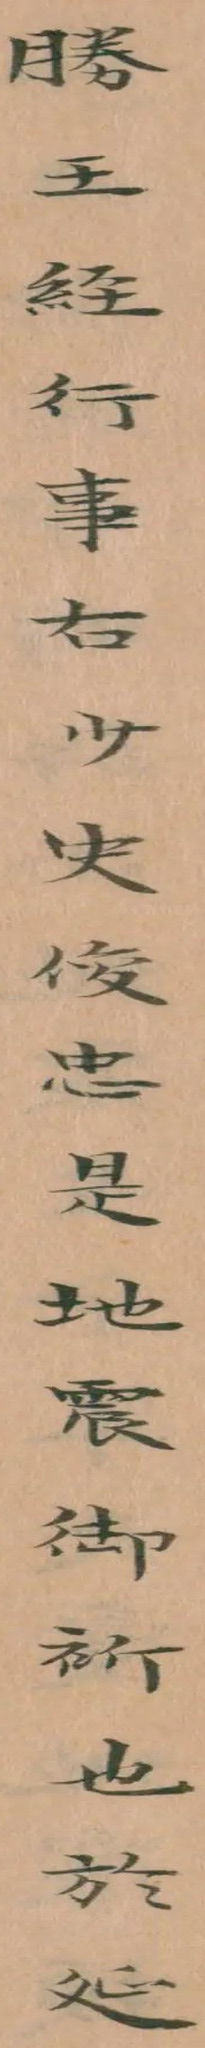勝王経行事右少史俊忠是地震御祈也於延
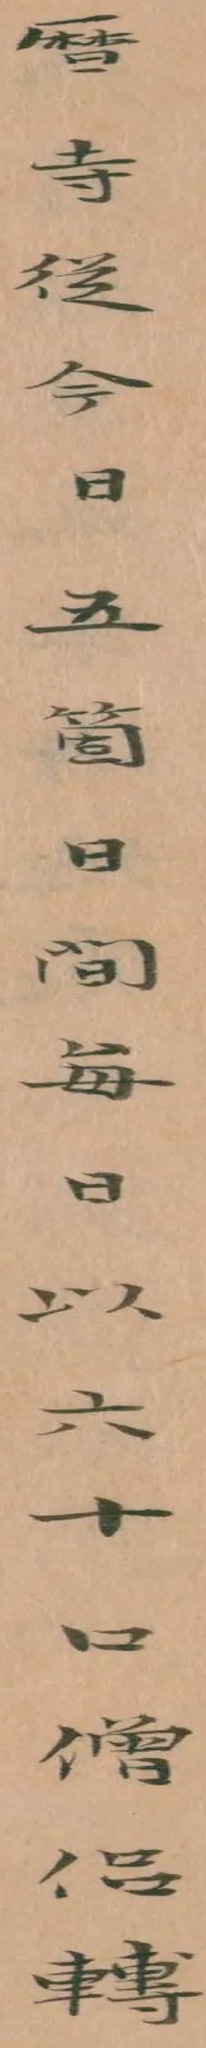暦寺従今日五箇日間毎日以六十口僧侶転
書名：地災撮要. 巻5-6(地震之部)
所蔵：国立国会図書館 National Diet Library, JAPAN
